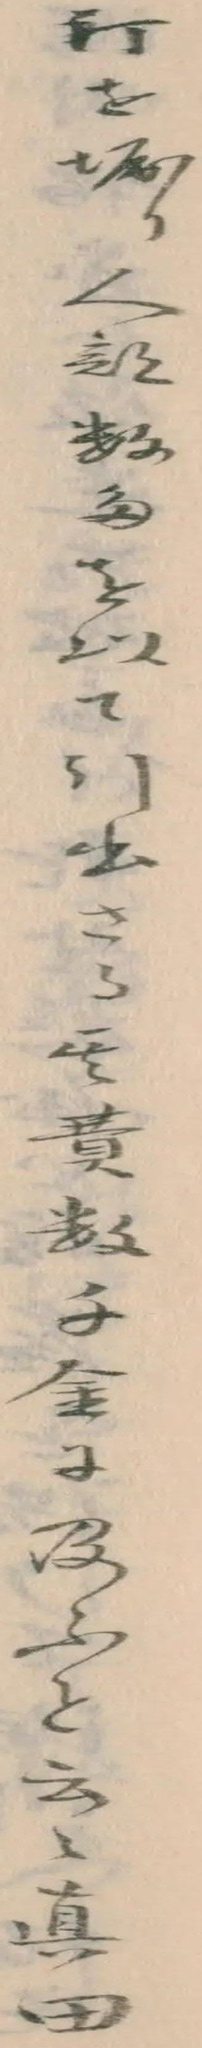汀を掘り人部数多を以て引出さる其費数千金に及ふと云々真田
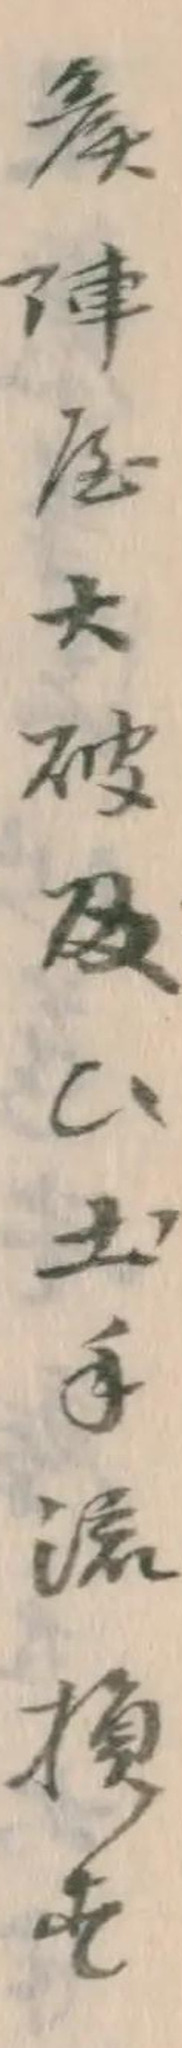侯陣屋大破及ひ土手流損す
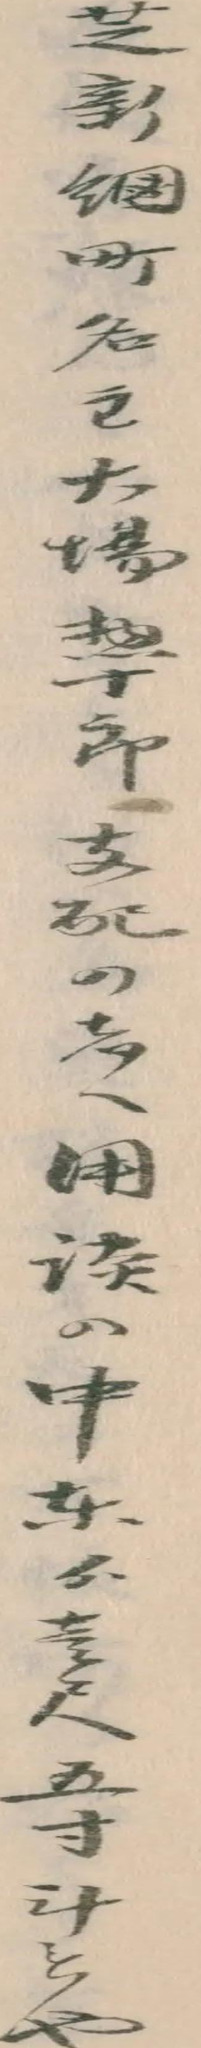芝新網町名主大場惣十郎支配の者へ用談の中東ゟ壹尺五寸斗もや
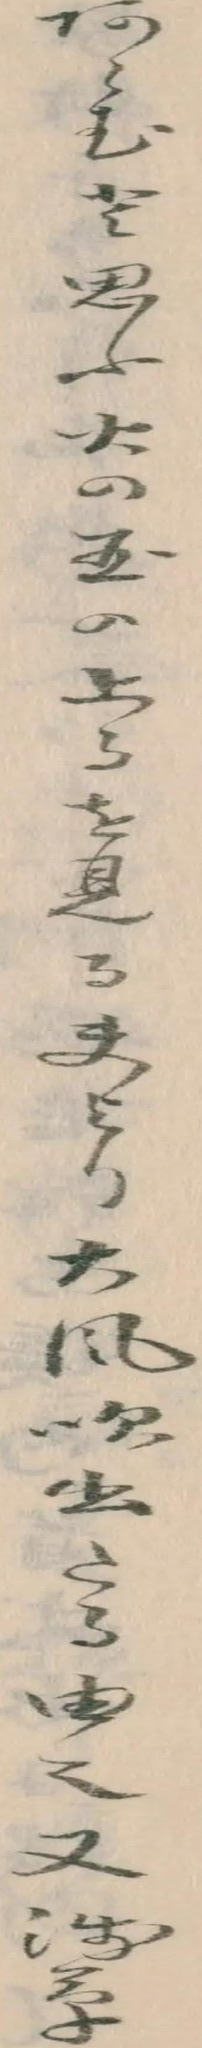あらむと思ふ火の玉の上るを見る夫より大風吹出たる由也又浅草
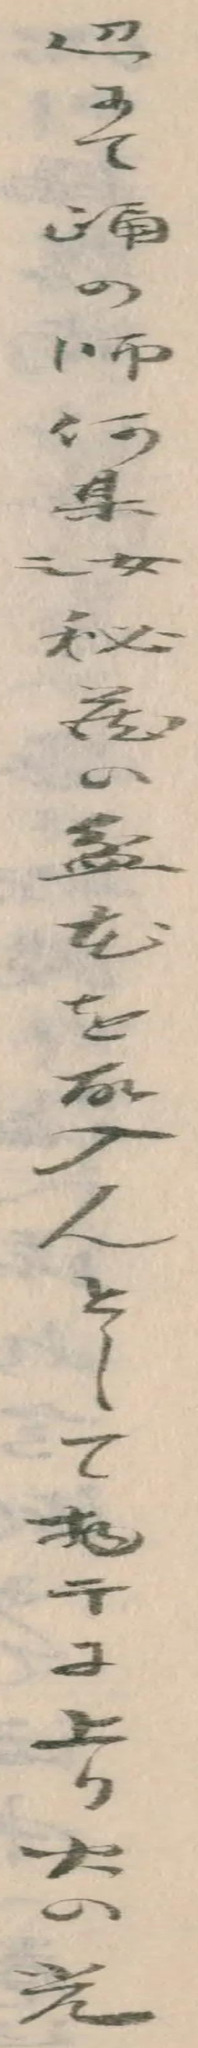辺にて踊りの師何某女也秘蔵の盆花を取入んとして物干に上り火の光
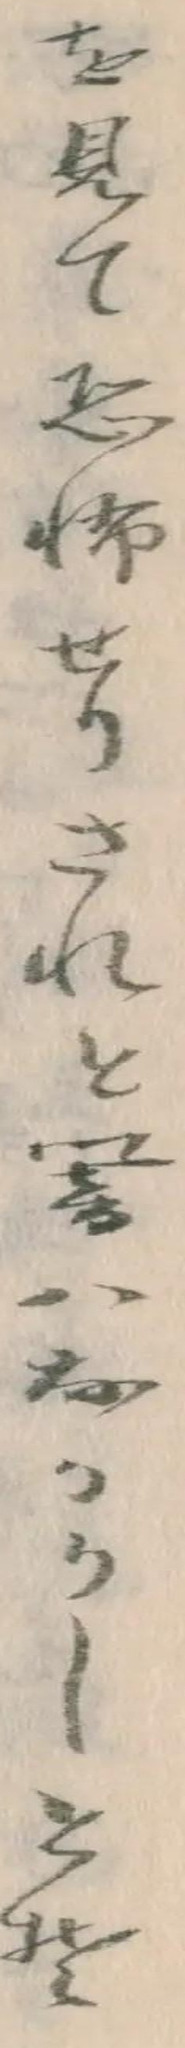を見て恐怖せりされと響はなかりしとそ
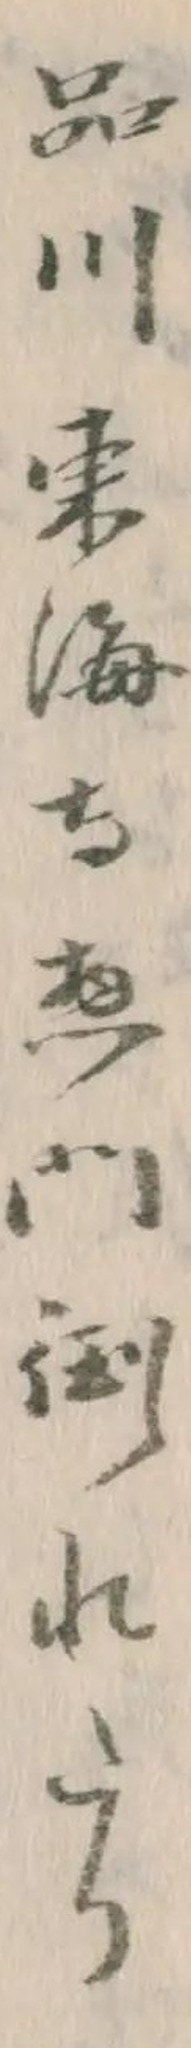品川東海寺惣門倒れたり
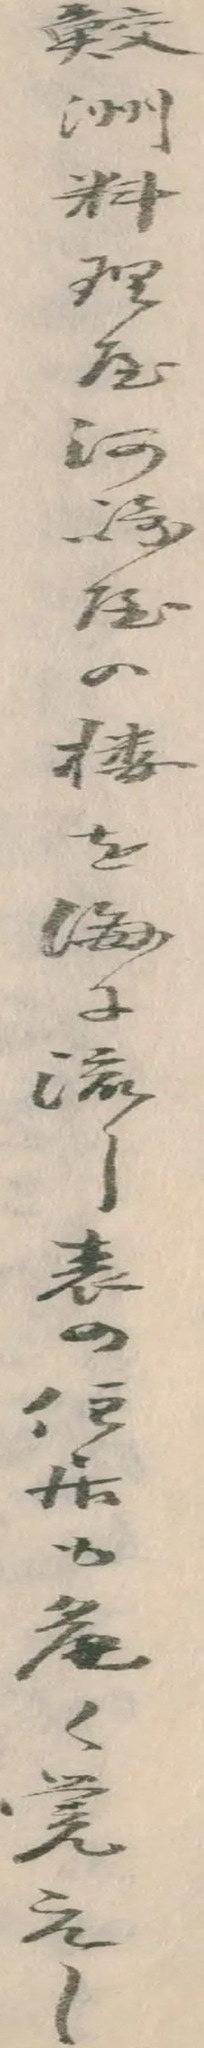鮫洲料理屋河崎屋の楼を海に流し表の住居も危く覚えし
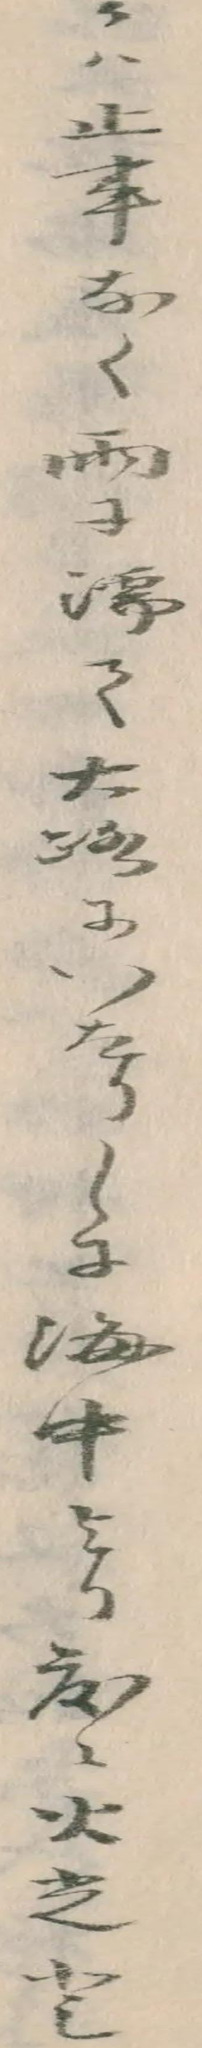かは止事なく雨に濡て大路にいたりしに海中より度々火光登
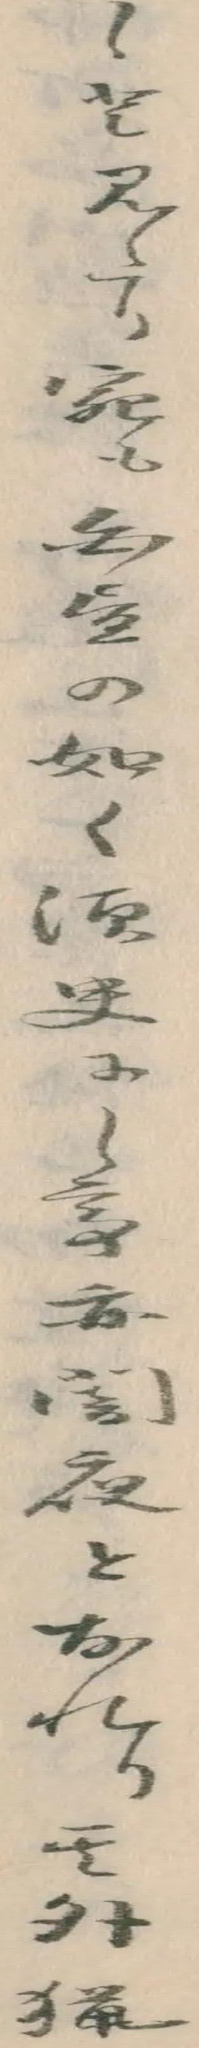しと見たり宛も白昼の如く須臾にして亦闇夜となれり其外猟

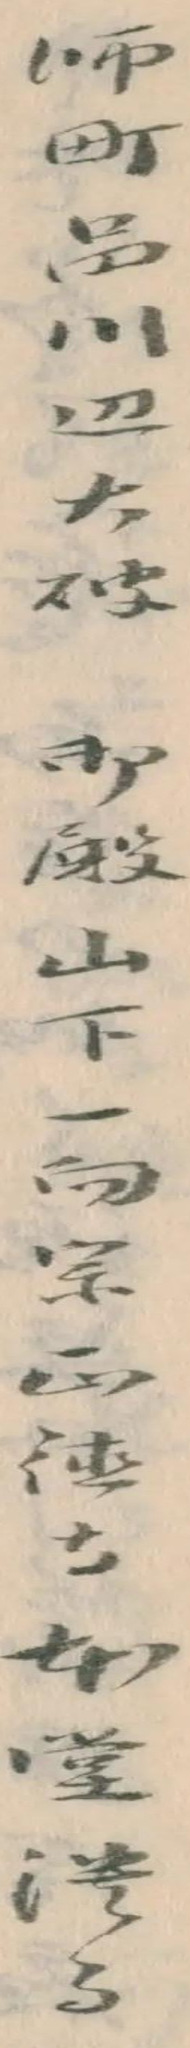師町品川辺大破御殿山下一向宗正徳寺本堂潰る
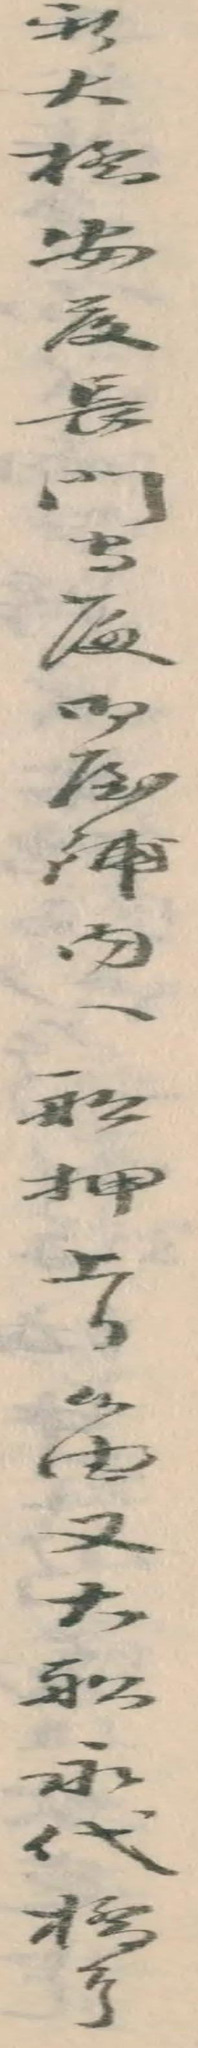新大橋安藤長門守殿御屋鋪内へ船押上り候由又大船永代橋に
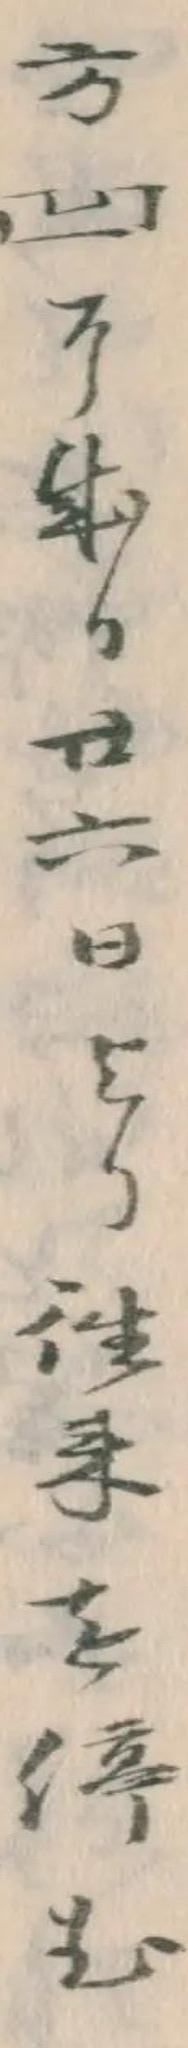方凹に成り廿六日より往来を停む
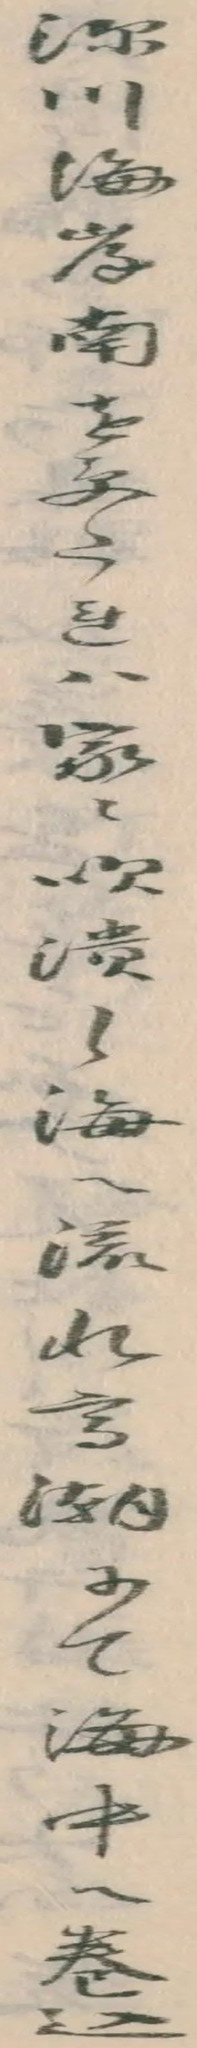深川海岸南を受たれは家々吹潰し海へ流れ高潮にて海中へ巻込
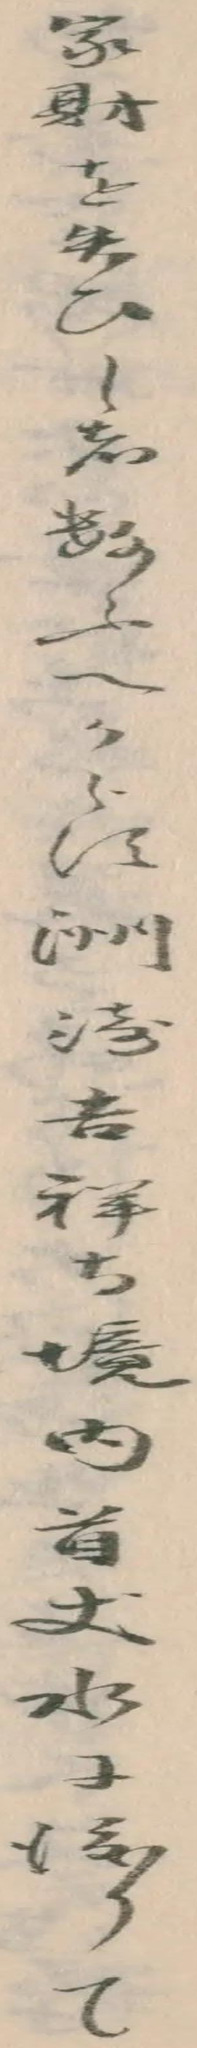家財を失ひし者数ふへからす洲崎吉祥寺境内首丈水に渡りて
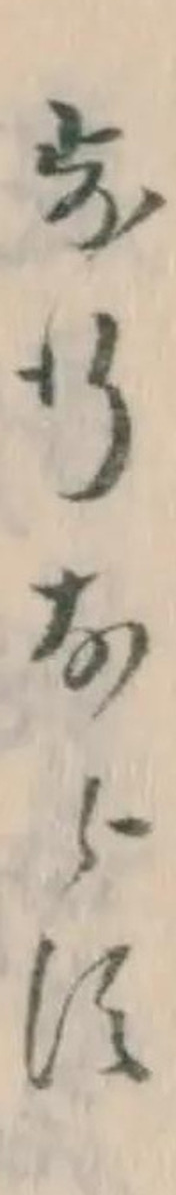歩行ならす
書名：地災撮要. 巻10(地震之部) 上,下
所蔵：国立国会図書館 National Diet Library, JAPAN
